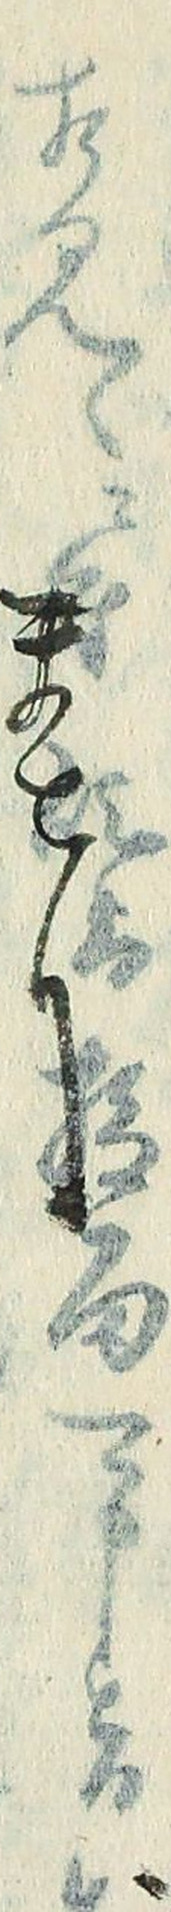未七月
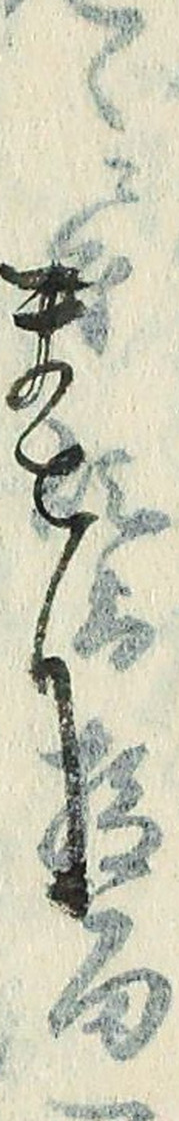未七月
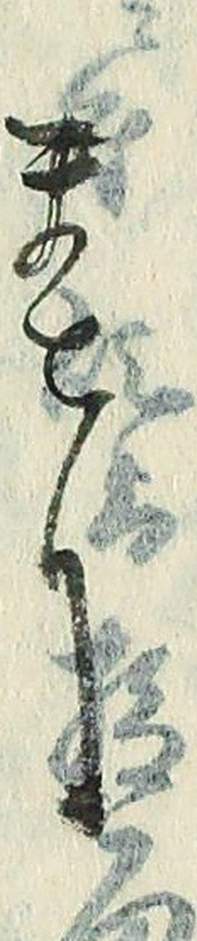未七月
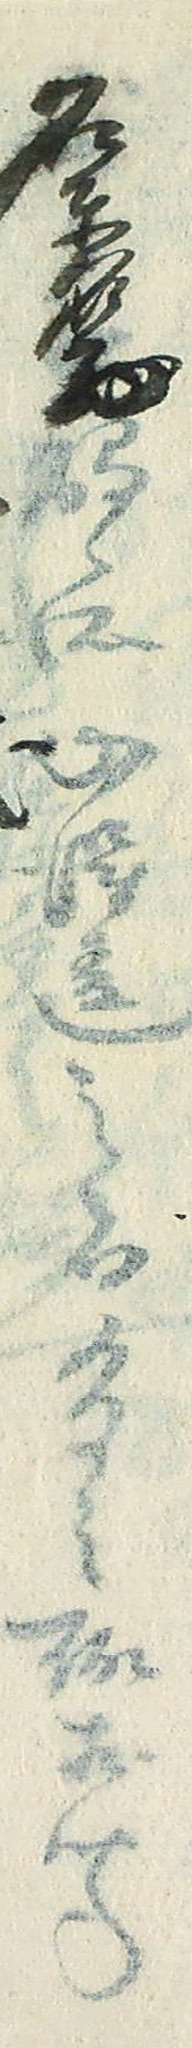名東名西
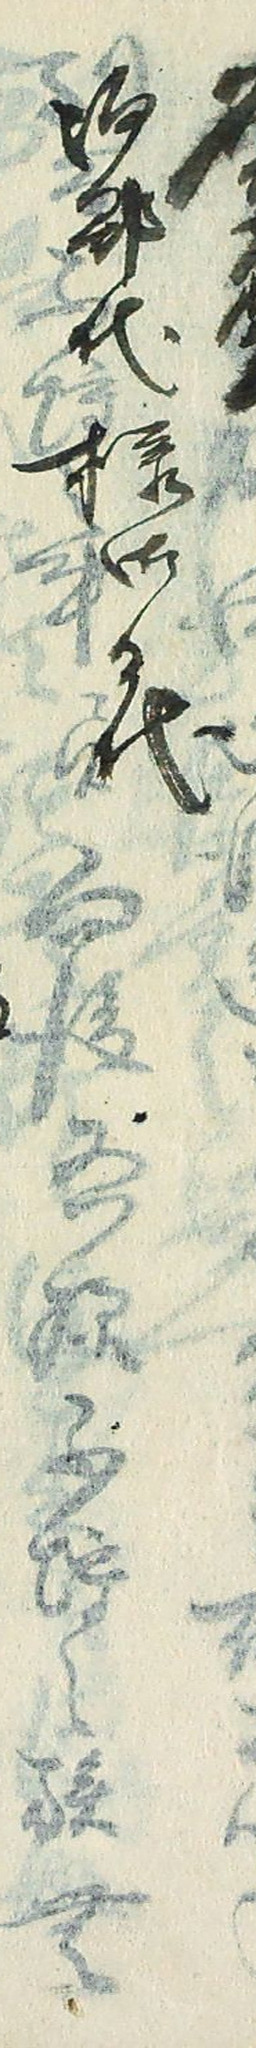御郡代様御手代
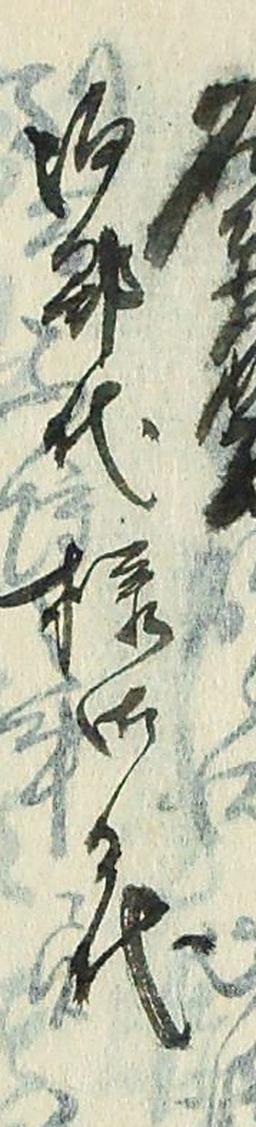御郡代様御手代
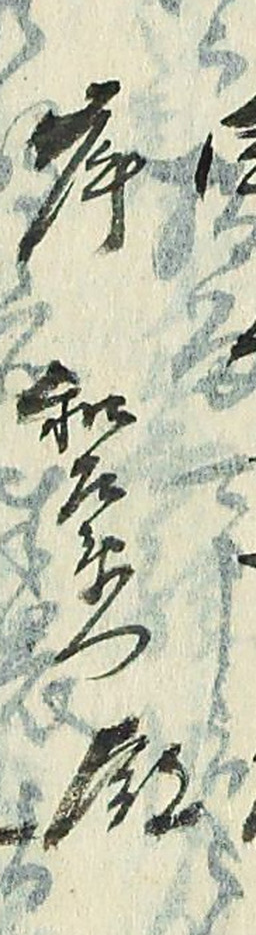岸和左衛門殿
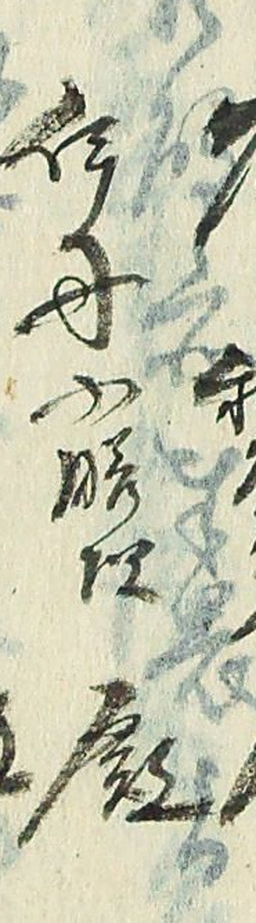伊丹小膳次殿
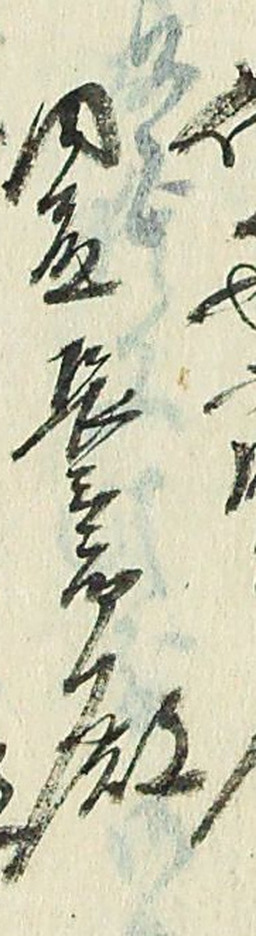内藤長三郎殿
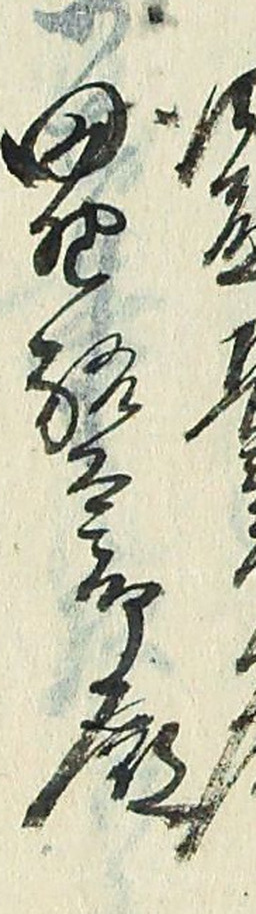田野祐太郎殿
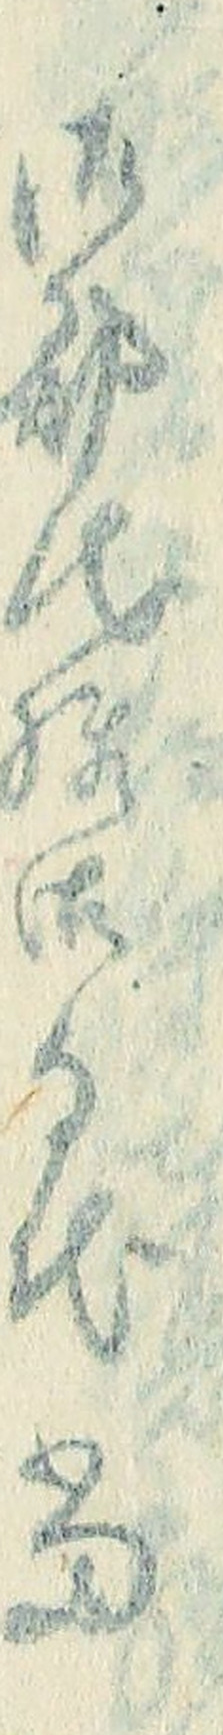御郡代様御手代
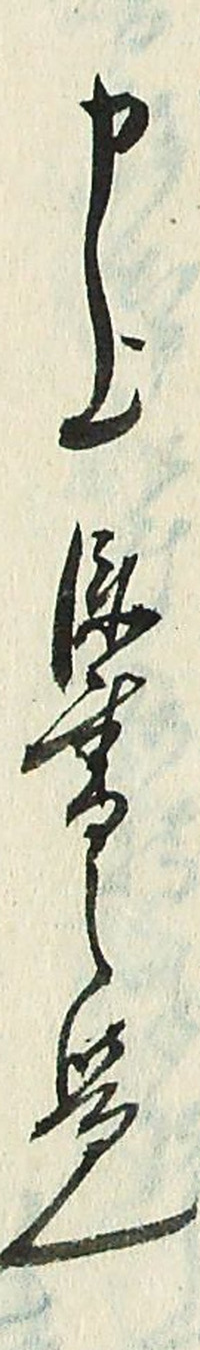申上添書之覚
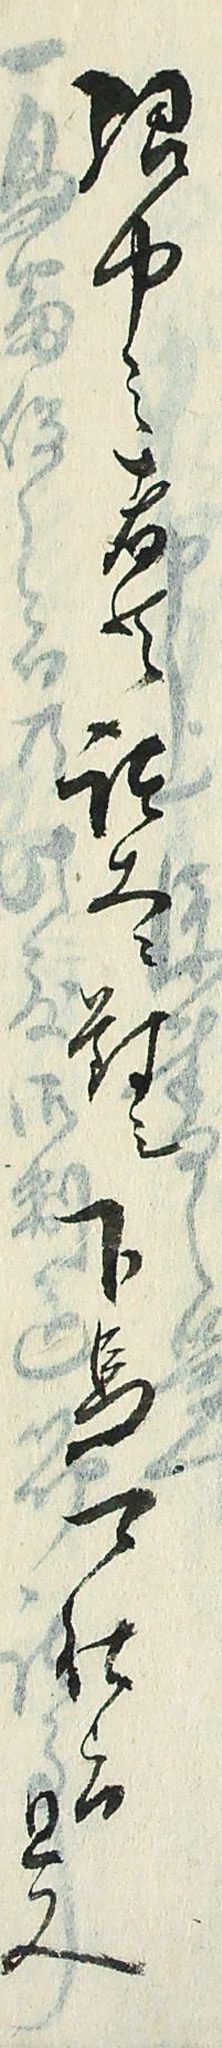郷中之者共諸士に対し下馬可仕旨

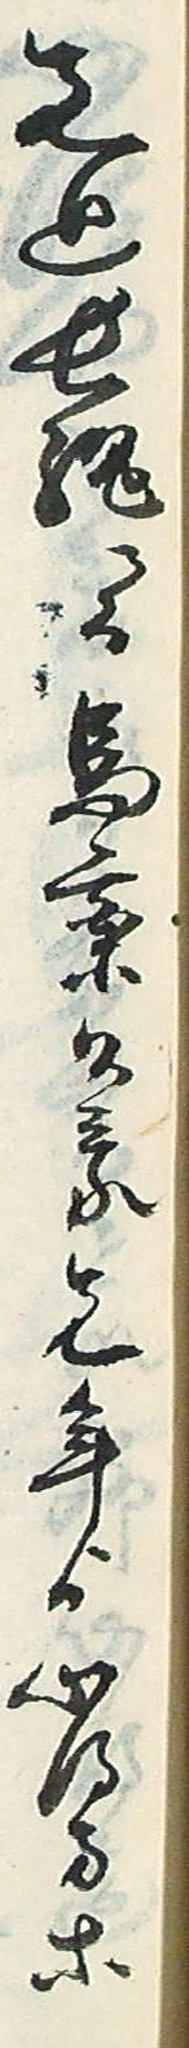先廻長縄に而馬乗候義先年ゟ心得方等
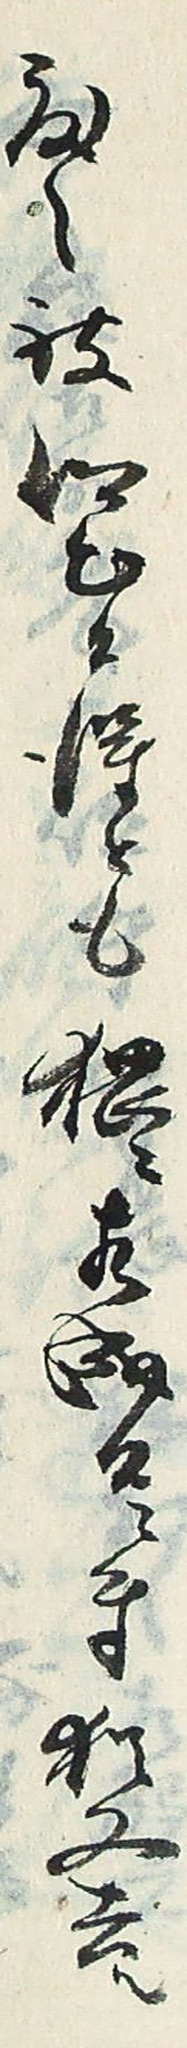度々被仰出候得とも猥に相成候に付猶又去る
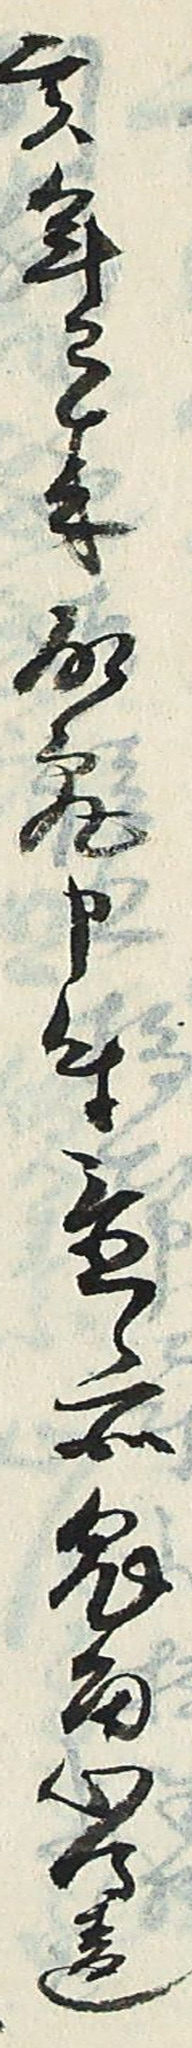亥年已来取究申付置候所兎角心得違
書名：諸御用御□受書控
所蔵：鳴門教育大学 Naruto University of Education
